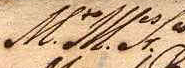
M.to Ill.es Sr.es
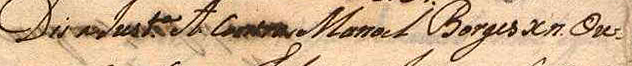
Dis a Iust.a A contra Manoel Borges x n. Ou
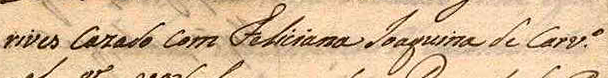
rives cazado com Feliciana Ioaquina de Carv.o
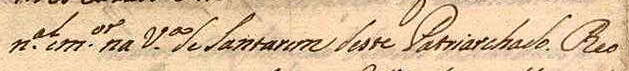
n.al e m.or na V.a se Santarem deste Patriarchado. Reo
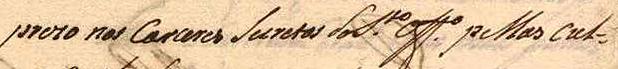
preso nos carceres Secretos do S.to Off.o pellas cul
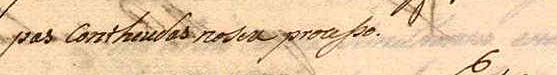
pas contheudas no seu processo.
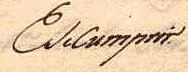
E se cumprir
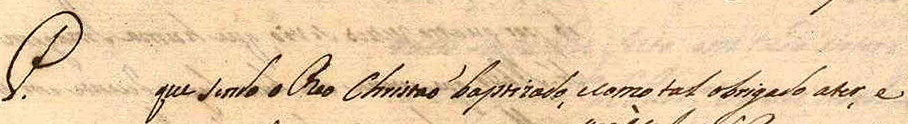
P. que sendo o Reo Christaõ baptizado, e como tal obrigado a ter, e
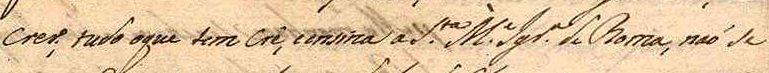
crer, tudo o que tem crê, e ensina a S.ta M.e Igr.a de Roma, naõ se
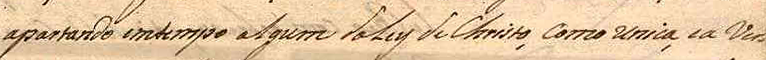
apartando em tempo algum da Ley de Christo, como unica, e a ver
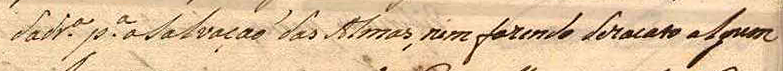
dadr.a p.a a salvaçaõ das Almas, nem fazendo dezacato algum
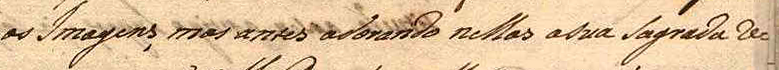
as Imagens, mas antes adorando nellas a sua sagrada Re
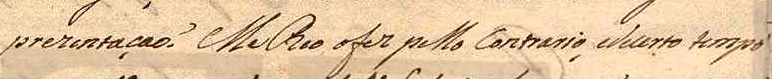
prezentaçaõ. Elle Reo o fez pello Contrario, e de certo tempo
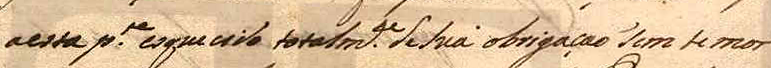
a esta p.te esquecido totalm.te de sua obrigaçaõ sem temor
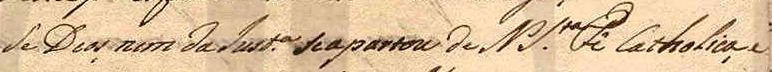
de Deos, nem da Iust.a se apartou de N. S.ta Fê Catholica, e
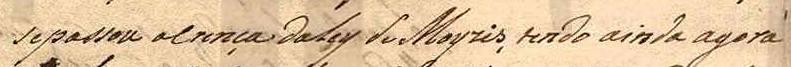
se passou a crença da Ley de Moyzés, tendo ainda agora
